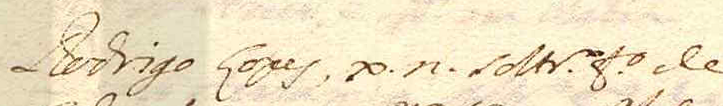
Rodrigo Lopes, x. n. soltr.o f.o de
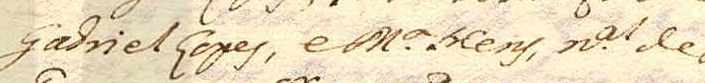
Gabriel Lopes, e M.a Hens, n.al de
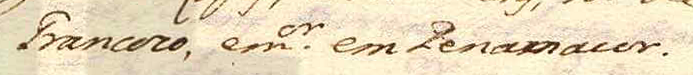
Trancozo, e mor. em Penamacor.
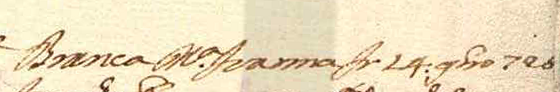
Branca M.a Joanna Jr 14. 9bro 726
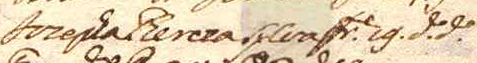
Jozepha Thereza sylva fr.e 19. d.o d.o
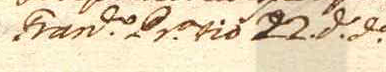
Fran.co Pr.a tio 22. d.o d.o
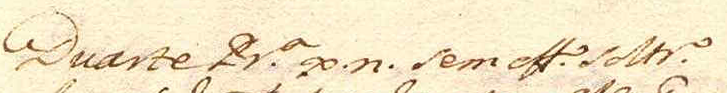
Duarte Pr.a x. n. sem off.o soltr.o
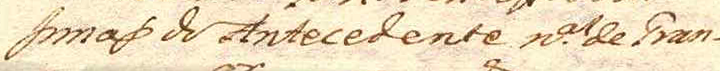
Jrmaõ do Antecedente n.al de Tran
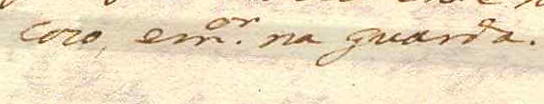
cozo, e mor. na Guarda.
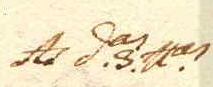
As d.a 3. tt.as
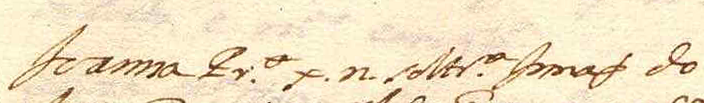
Joanna Pr.a x. n. soltr.a Jrmaꝭ do
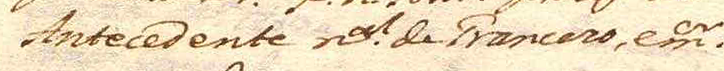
Antecedente nal de Trancozo, e mor.
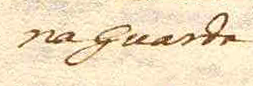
na Guarda
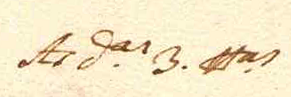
As d.as 3. tt.as
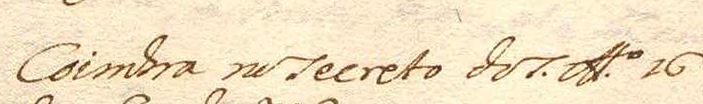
Coimbra no secreto do s. off.o 16
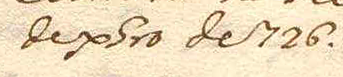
de xbro de 726.
